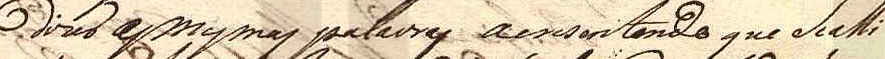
dizer as mesmas palavras acresentando que se alli
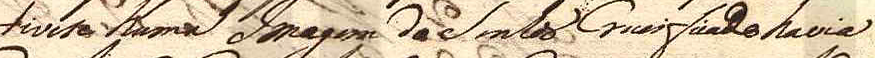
tivese huma Imagem do Senhor Crucificado havia
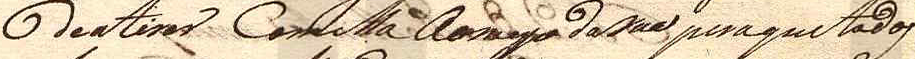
de atirar Com ella ao meyo da rua para que todos
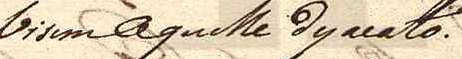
visem aquelle desacato.
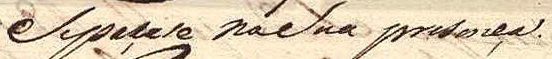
se paçase na Sua presença.
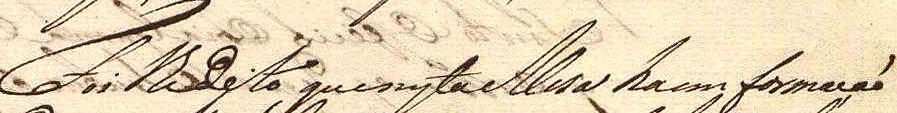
Foi lhe dito que nesta Mesa ha emformaçaõ
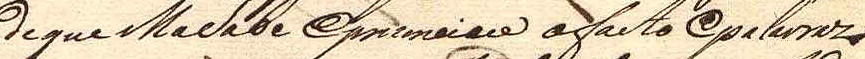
de que ella Sabe e prezenciou o facto e palavraz
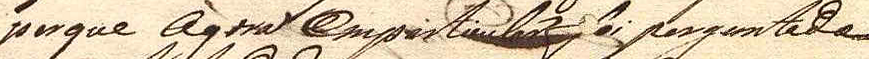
porque agora em particular foi perguntada
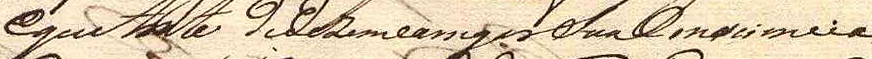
e que trate de deZemcarregar Sua Consciencia
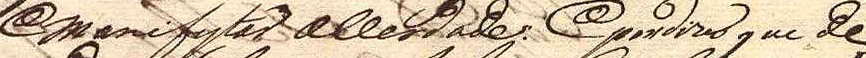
e manifestar a Uerdade E por dizer que de
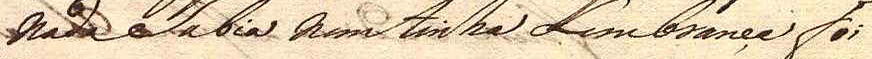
nada Sabia nem tinha Lembrança foi
